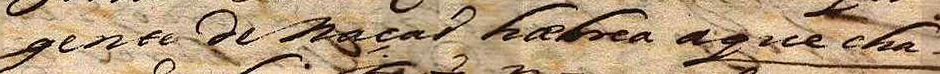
gente de naçaõ hæbrea a que cha
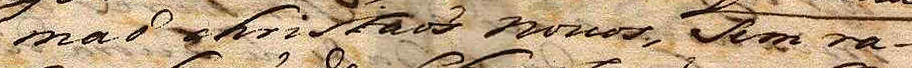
maõ christaõs nouos, sem ra
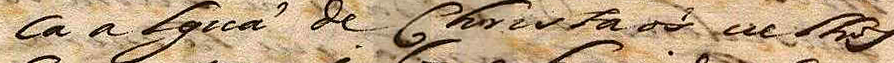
ça alguā de Christaõs uelhos
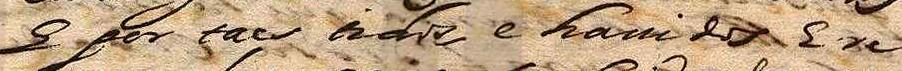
E por taes tidos, e hauidos E re
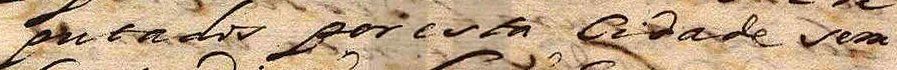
putados por esta cidade sem
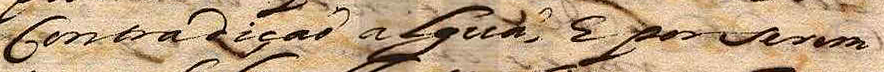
Contradiçaõ alguā, E por serem
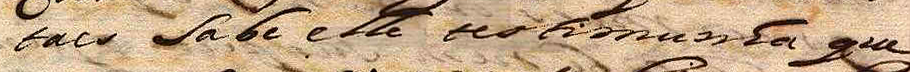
taes Sabe elle testimunha que
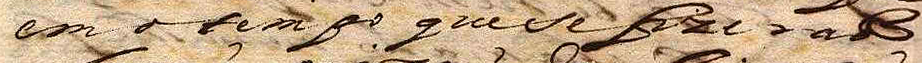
em o tempo que se fizeraõ
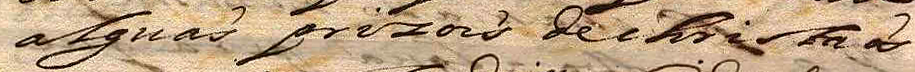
alguas̄ prizoĩs de christaõs
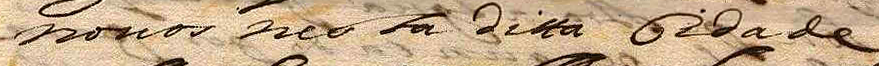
nouos nesta ditta Cidade
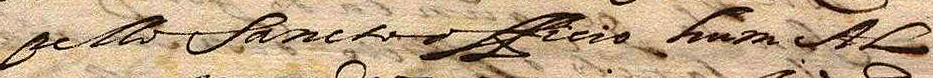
pello Sancto officio hum AL
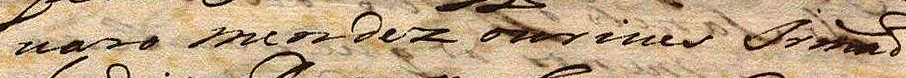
uaro mendez ouriues Irmaõ
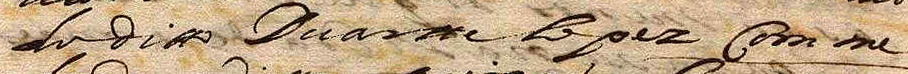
do ditto Duarte lopez Com me
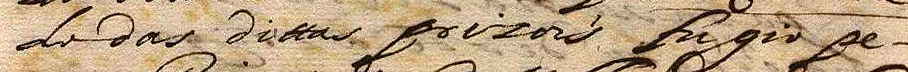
do das dittas prizoĩs fugio pe
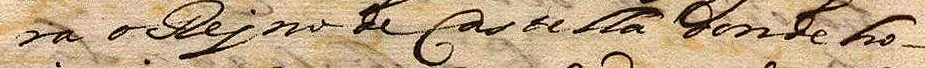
ra o Rejno de Castella donde ho
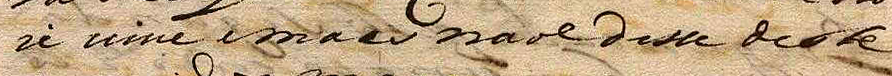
ie uiue e maes naõ disse deste
